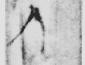人
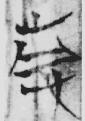情
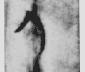人
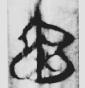因
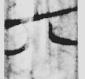亓（其）
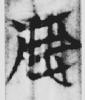情
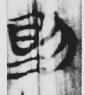則
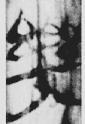樂
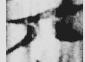亓（其）
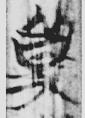事
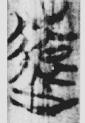遠
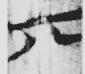亓（其）
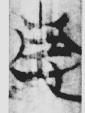情
